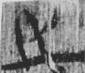之
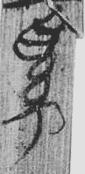○（奚）
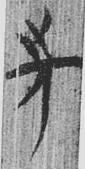先
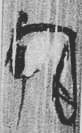侌（陰）
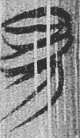昜（陽）
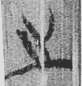之
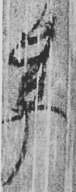○（奚）
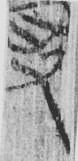○（得）
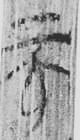而
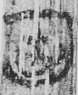固
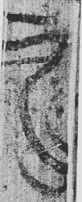水
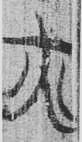火
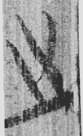之
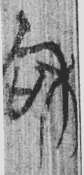和
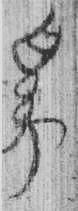○（奚）
